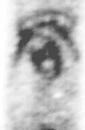君
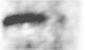一
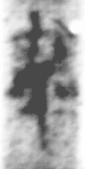𨍱（乘）
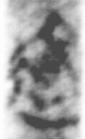○（路）
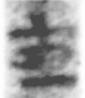車
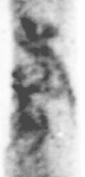○（陽）
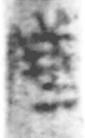城
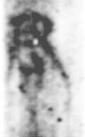君
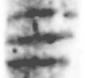三
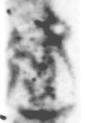○（路）
